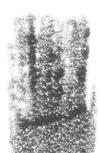可
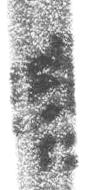唬（嘑）
